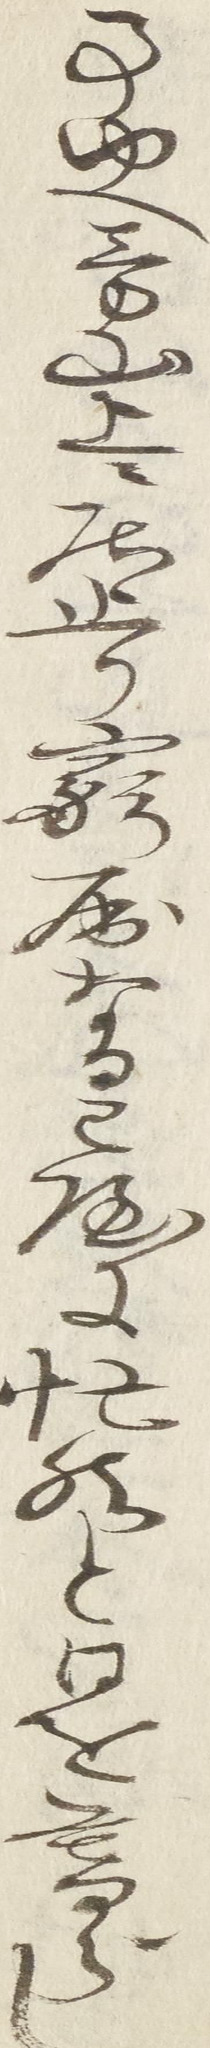事ゆへ旁山上に居止り窮屈なる己屋に忙然と日を暮らし
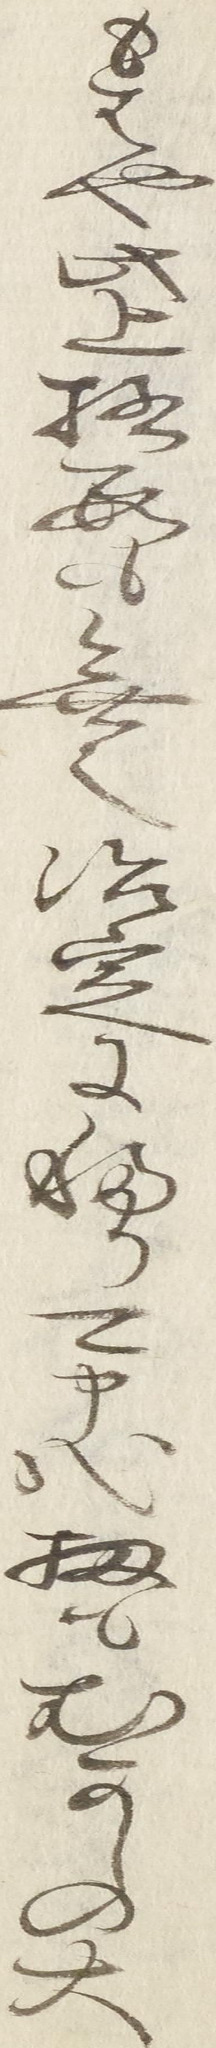もはや此上格段も無之治定に移り可申哉扨もむかしの大
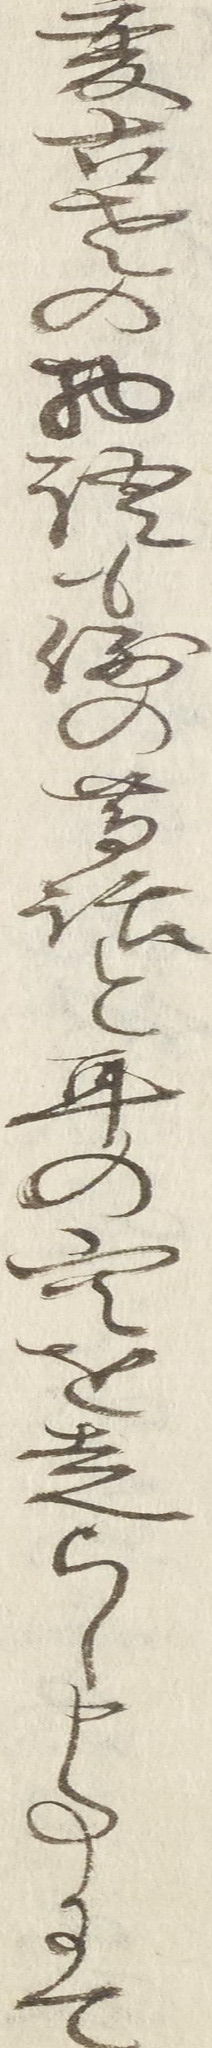変古老の物語も例の昔話と耳の穴を走らし申事にて
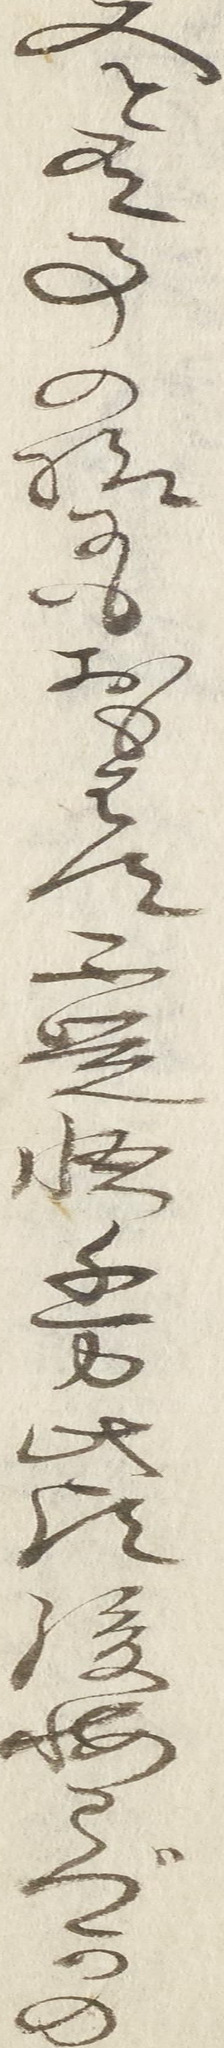又と有事の様にもおもはす不覚悟千万此頃後悔わづかの
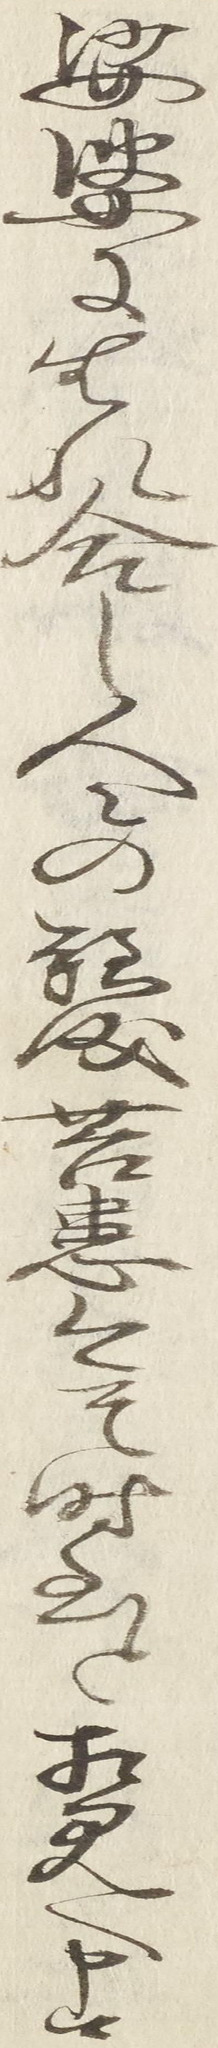娑婆に生れ合し人々の難義苦患今そ時至と相見へ申候
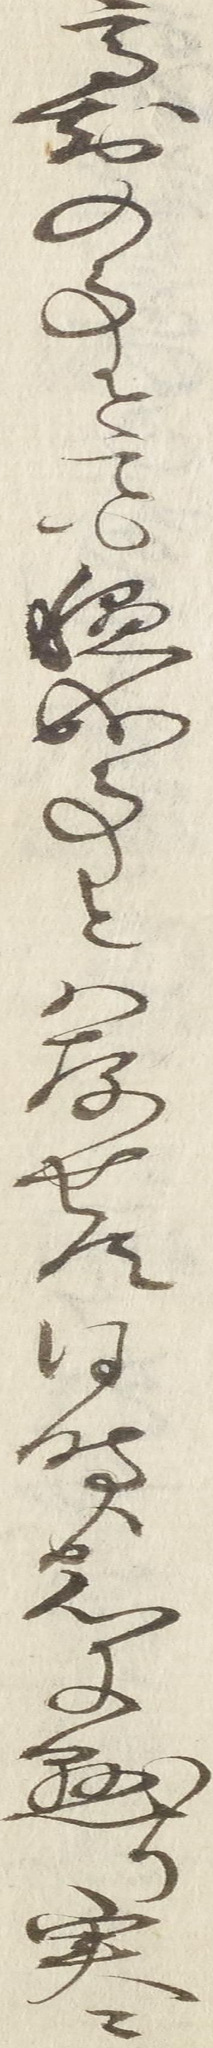高知の事とても穏成事とは存ぜす同時ゟ心に懸り実に
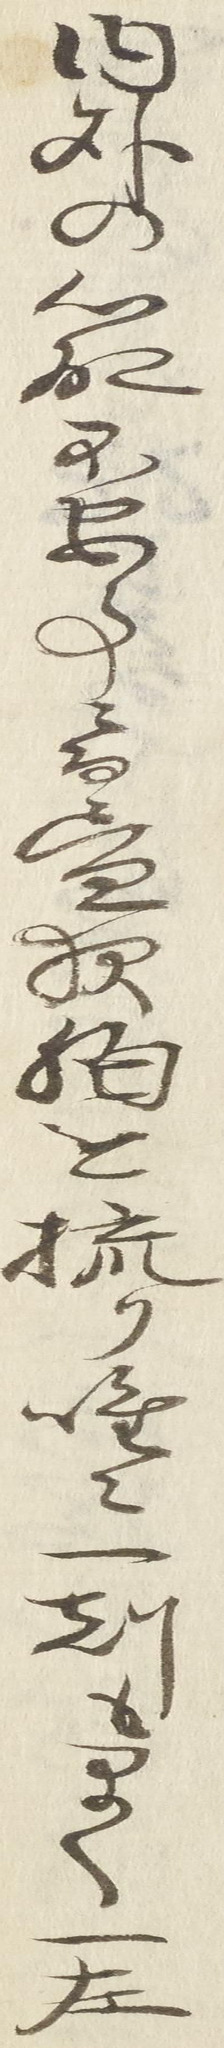内外の心配不安事二而昼夜狗を梳り唯々一刻も早く一左
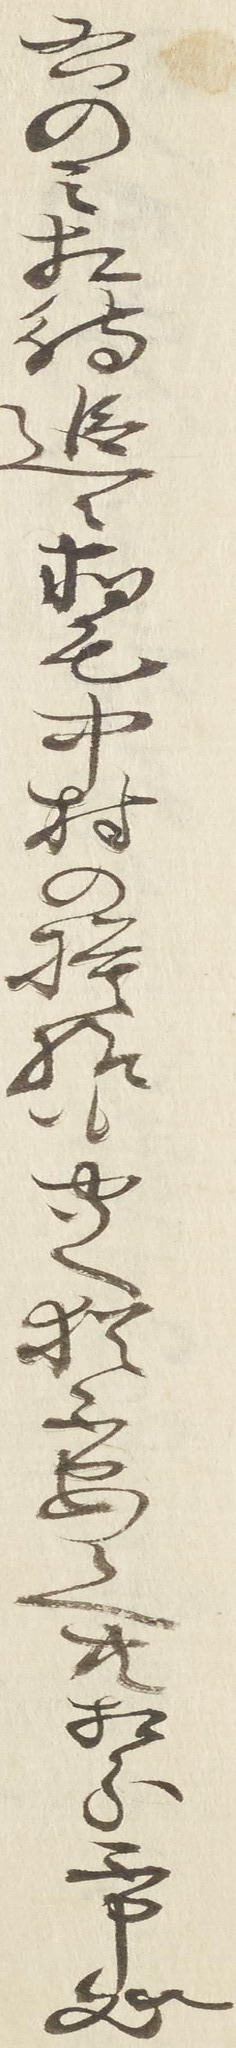右のみ相待追々宿毛中村の模様も聞へ猶不安候へ共相分不申処
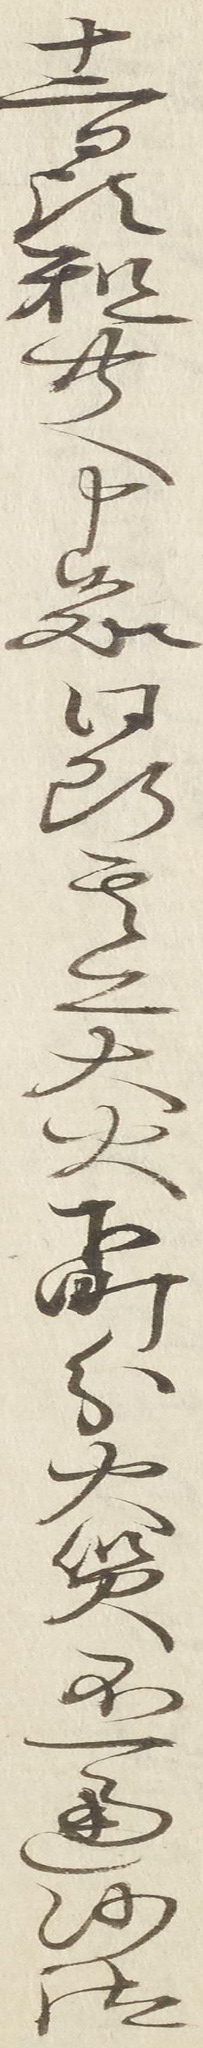十二日頃親共へ申候処同断其上大火下町分火災不一通沙汰
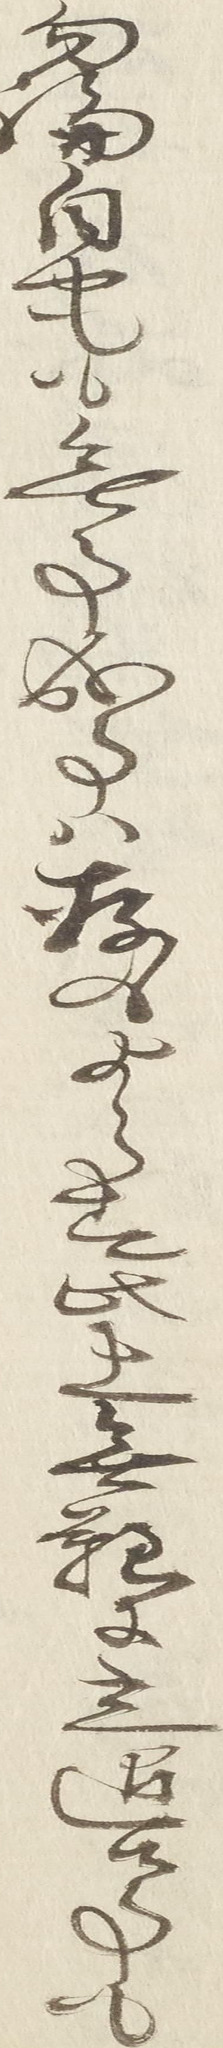勿論自宅も無事なる事は存しもよらす此上無難に立退候事も
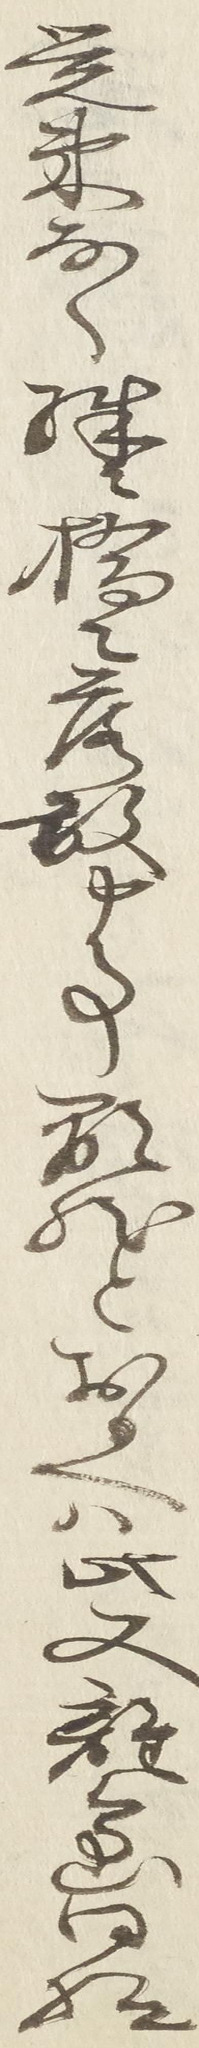覚束なく殊に橋々落放申事顕然とおもへは此又離嶋同様
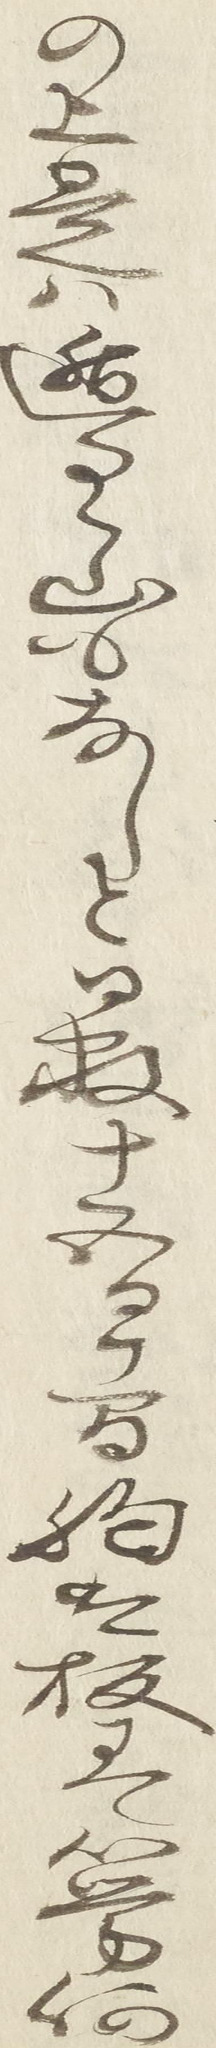の上是は遁るゝ山もなしと日数十五日ヶ間狗盤板にて心労何
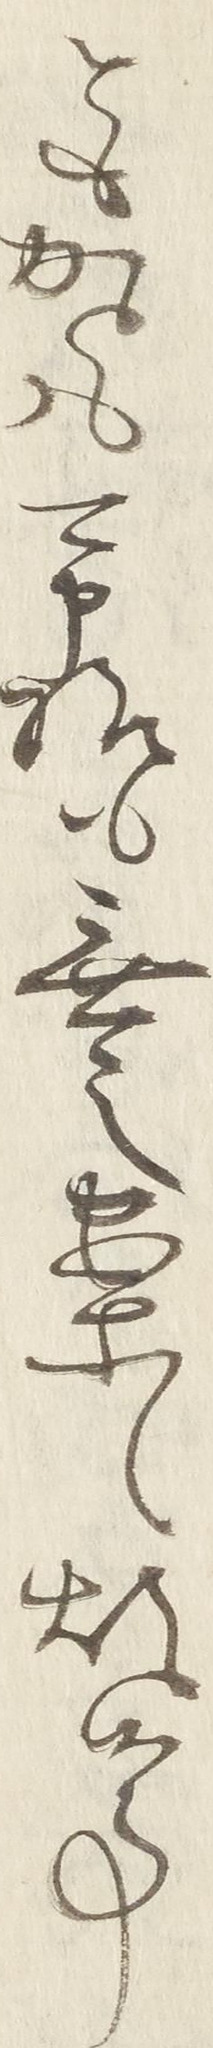ともかとも可申様も無之案し候故候事
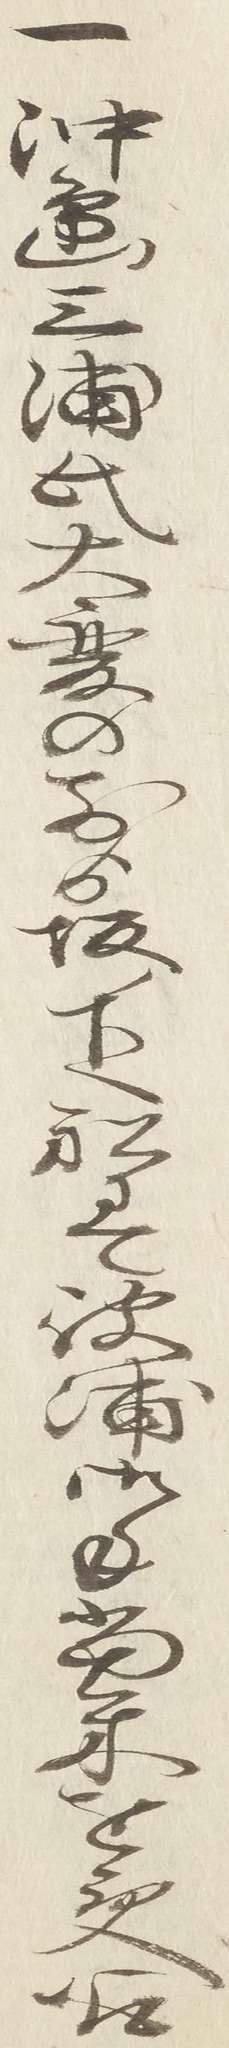一沖島三浦氏大変の前ゟ坂下へ船にて彼浦御手当米を受取
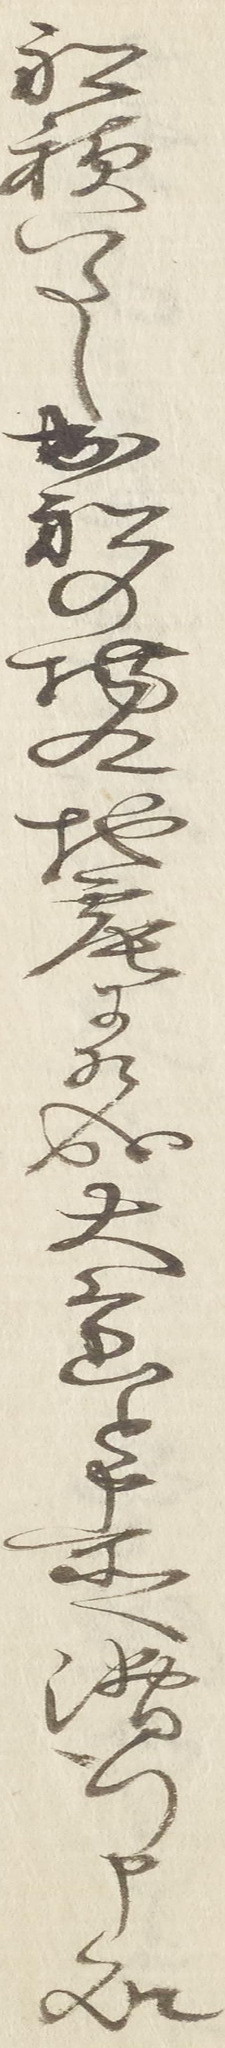舟積いたし出船の場合地震に相成大嶋と申所へ漕行申候処
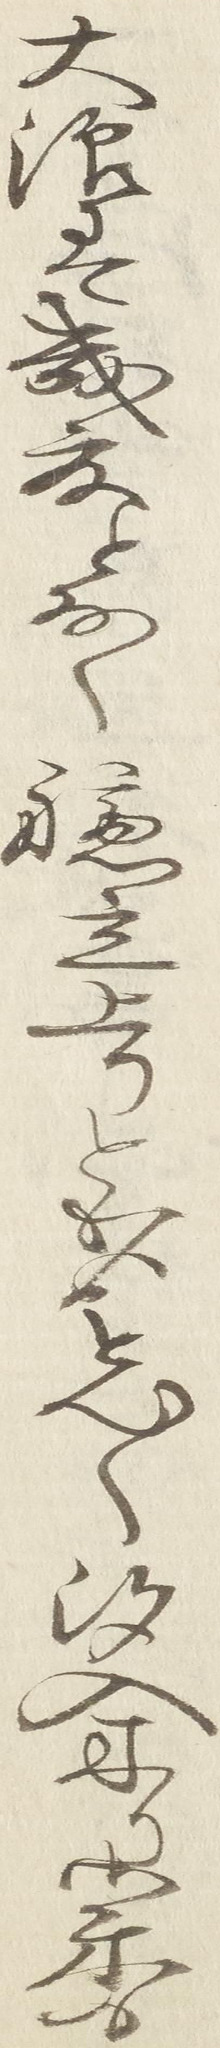大浪にて幾度となく艫立上りともゟとん〳〵汐入来り御米も
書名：地震記　下
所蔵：東京大学地震研究所図書室 Earthquake Research Institute Library, The University of Tokyo, JAPAN
